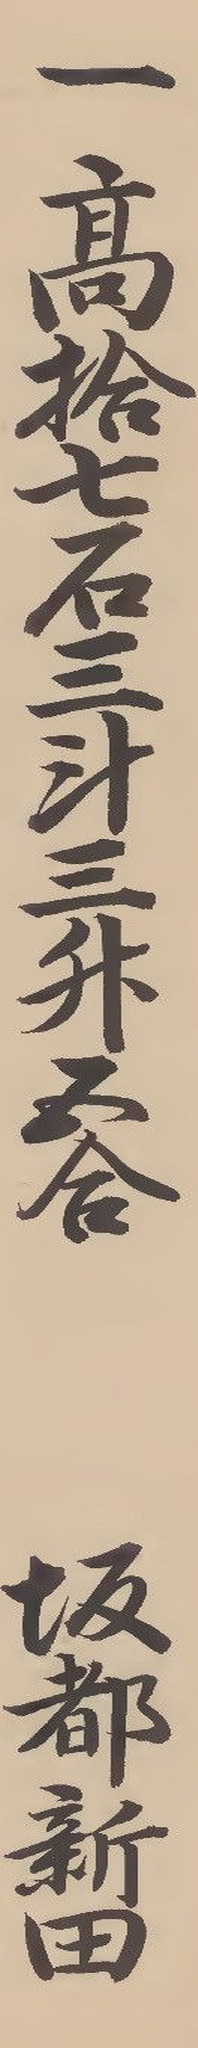一高拾七石三斗三升五合坂都新田
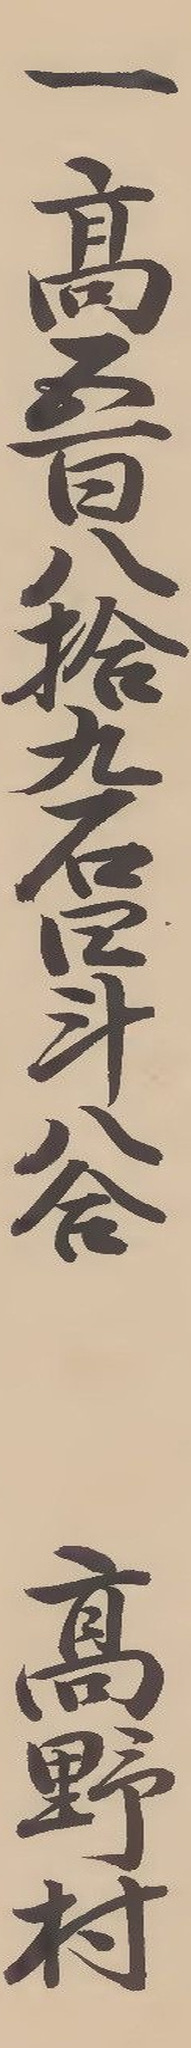一高五百八拾九石四斗八合高野村
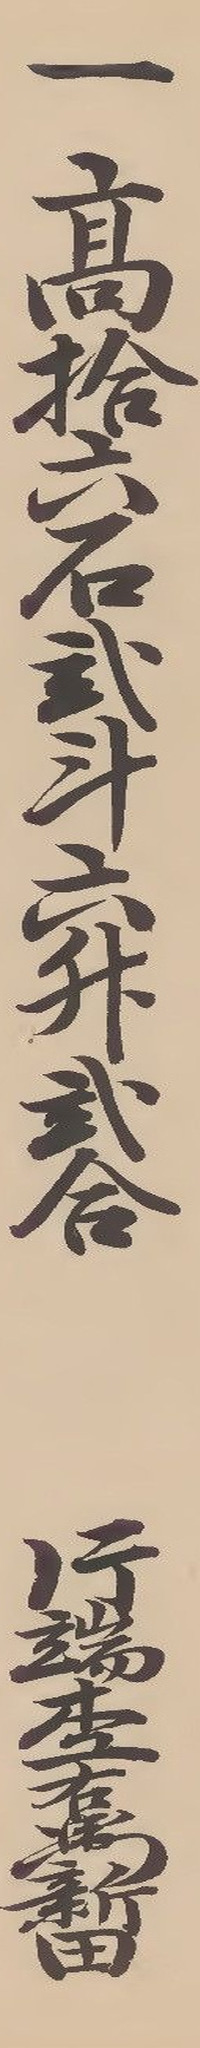一高拾六石弐斗六升弐合片端杢右衛門新田
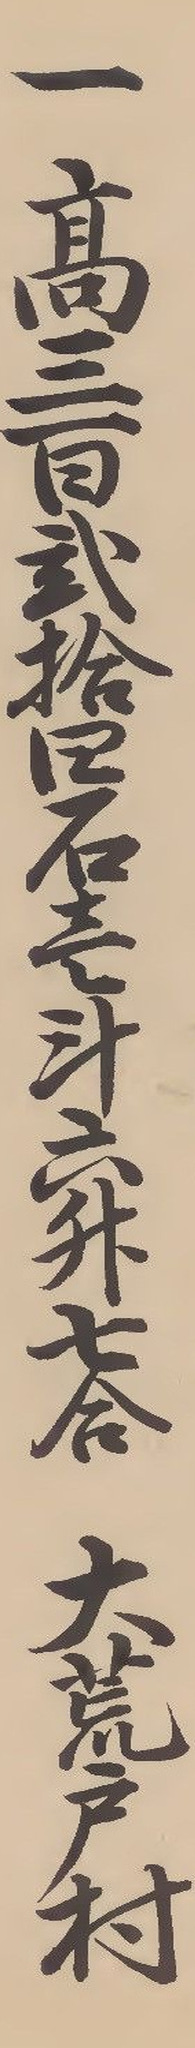一高三百弐拾四石壱斗六升七合大荒戸村
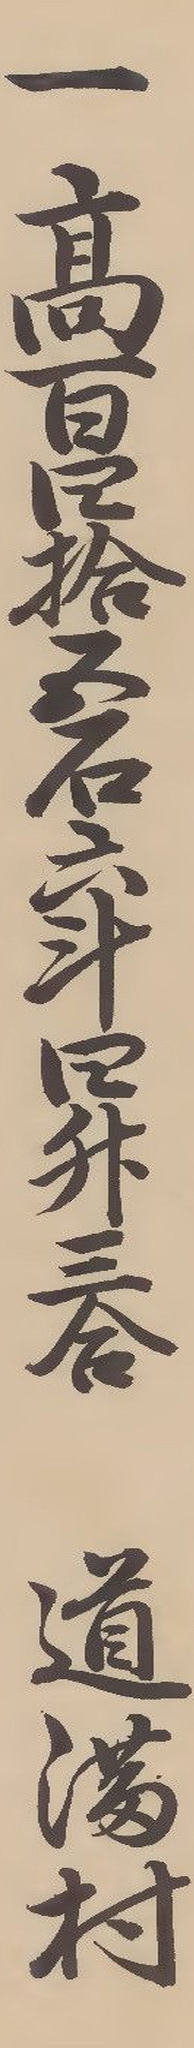一高百四拾五石六斗四升三合道満村
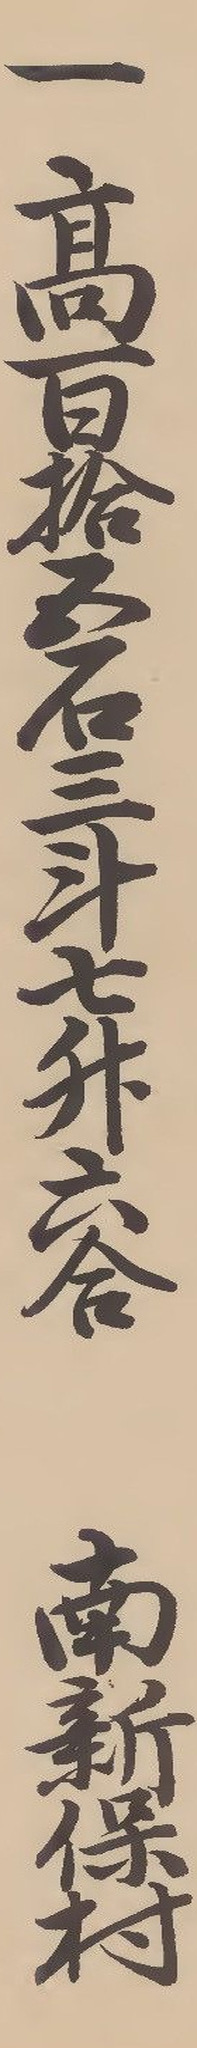一高百拾五石三斗七升六合南新保村
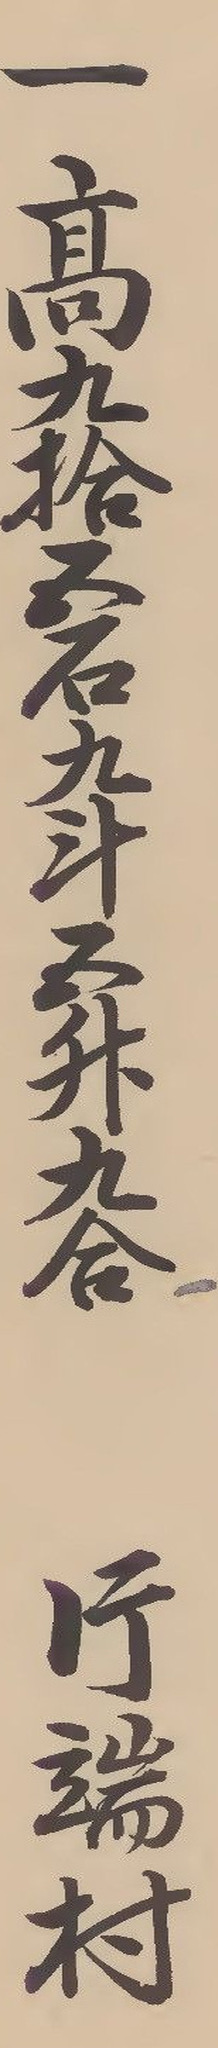一高九拾五石九斗五升九合片端村

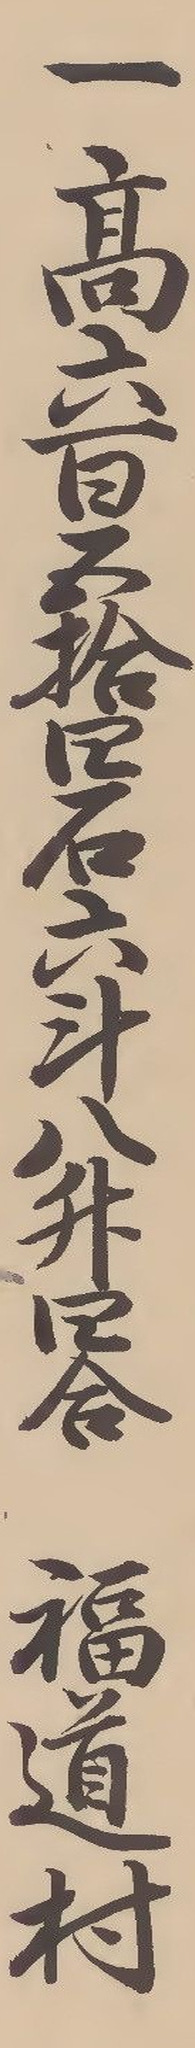一高六百五拾四石六斗八升四合福道村
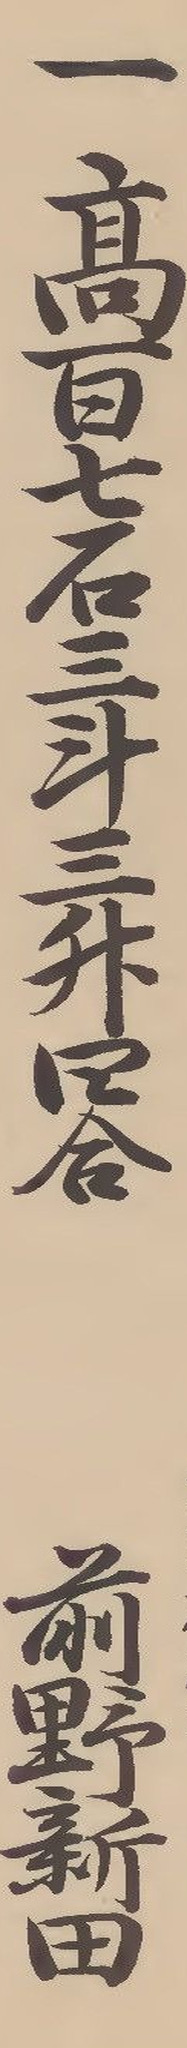一高百七石三斗三升四合前野新田
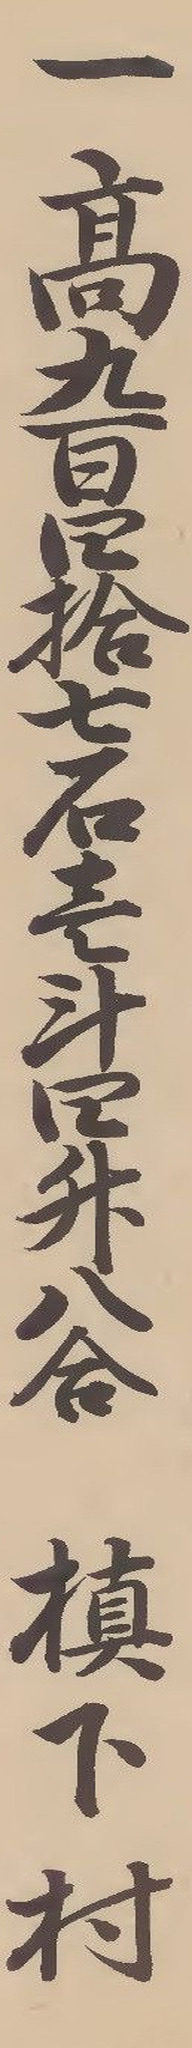一高九百四拾七石壱斗四升八合槙下村
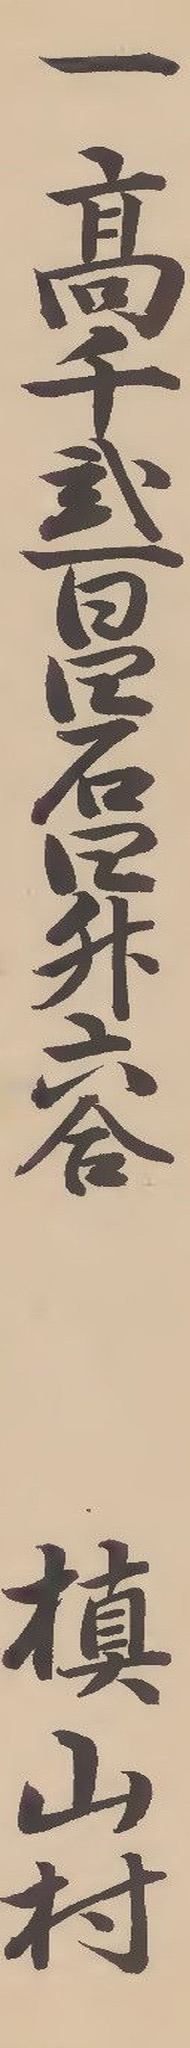一高千弐百四石四升六合槙山村
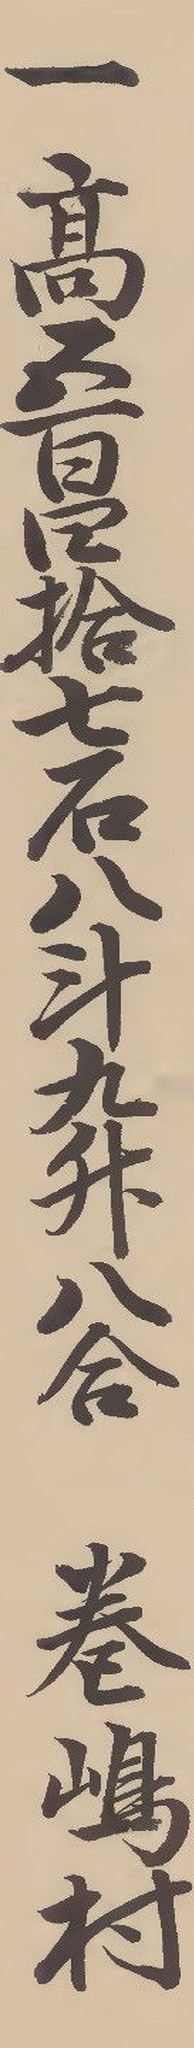一高五百四拾七石八斗九升八合巻島村
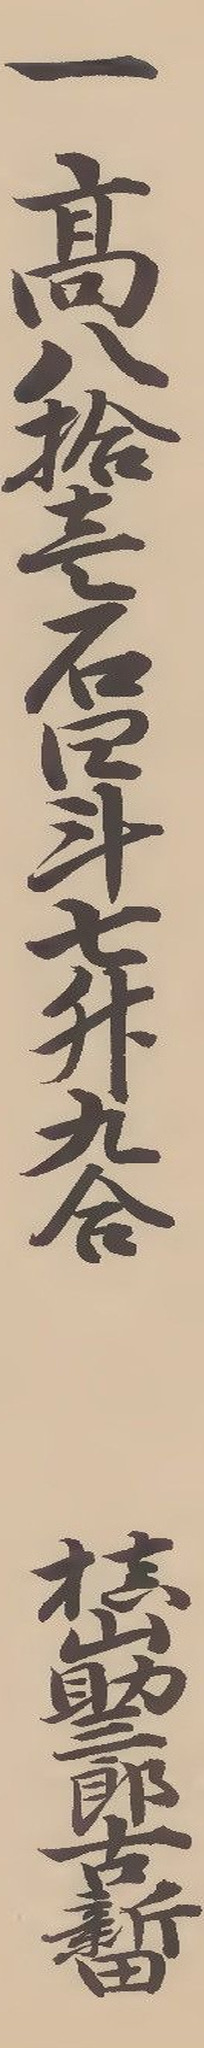一高八拾壱石四斗七升九合槙山助三郎古新田

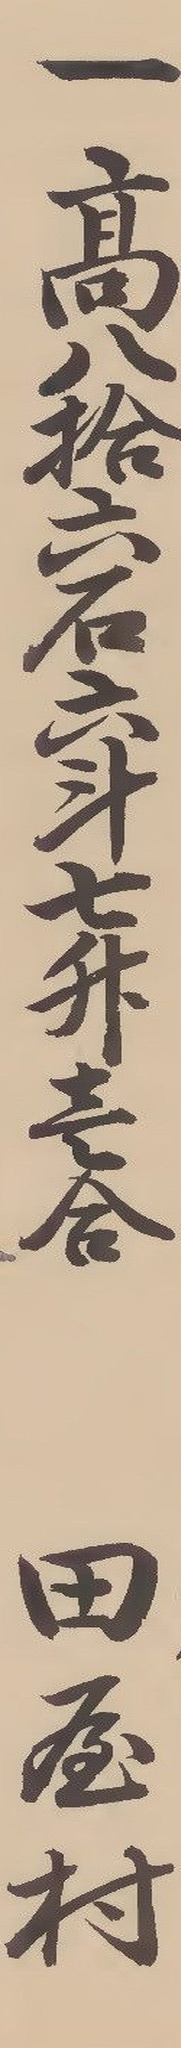一高八拾六石六斗七升壱合田屋村
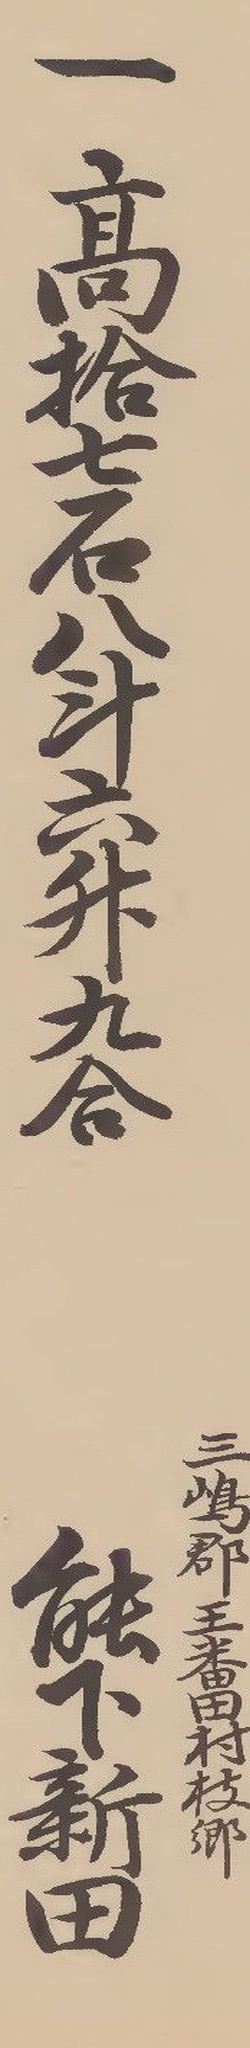一高拾七石八斗六升九合能下新田
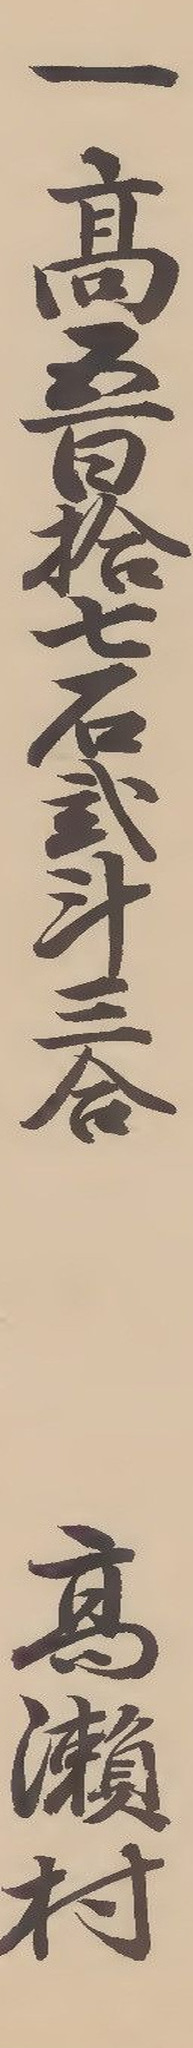一高五百拾七石弐斗三合高瀬村
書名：越後国郷帳　中
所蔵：国立公文書館 National Archives of Japan
